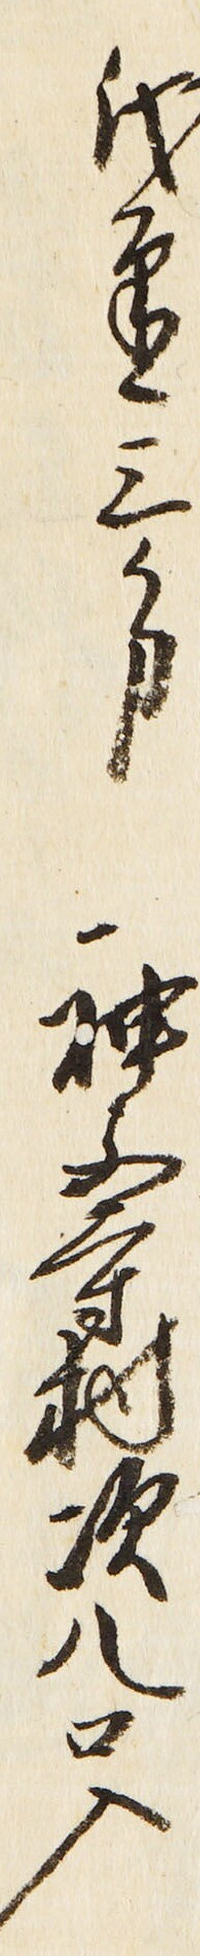代金三分神宮寺村次八口入
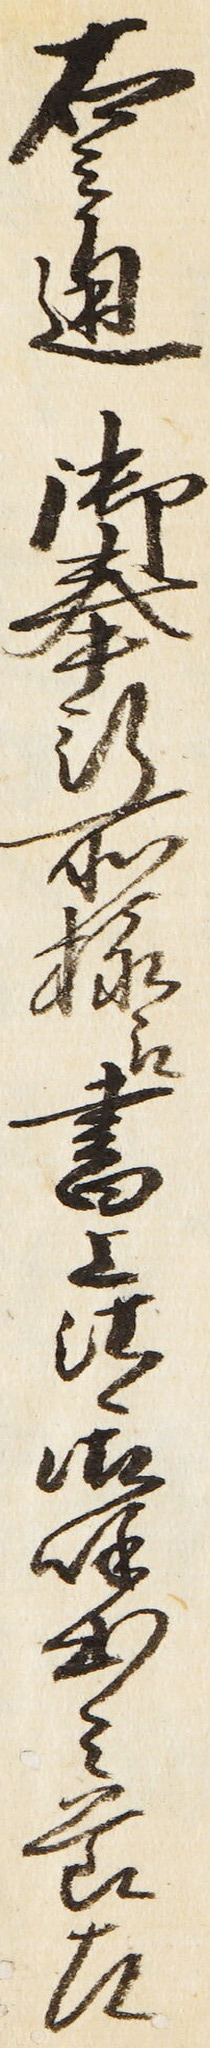右之通御奉行所様江書上仕候御呼出之節左
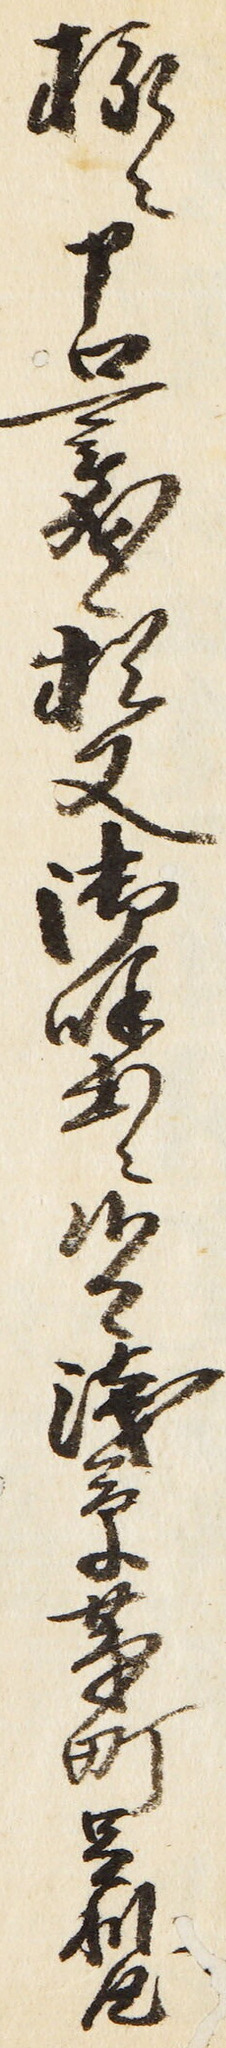様ニ申口可被成候猶又御呼出ニ候ハヽ浅草茅町足利屋
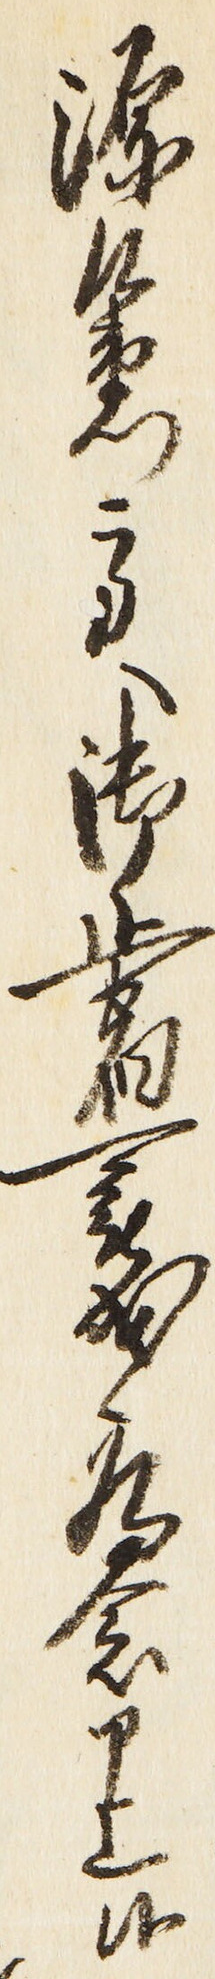源左衛門方へ御止宿可被成為念申上候
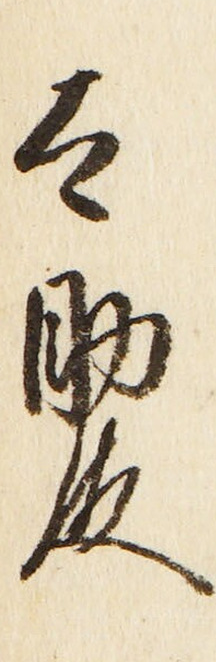太助殿

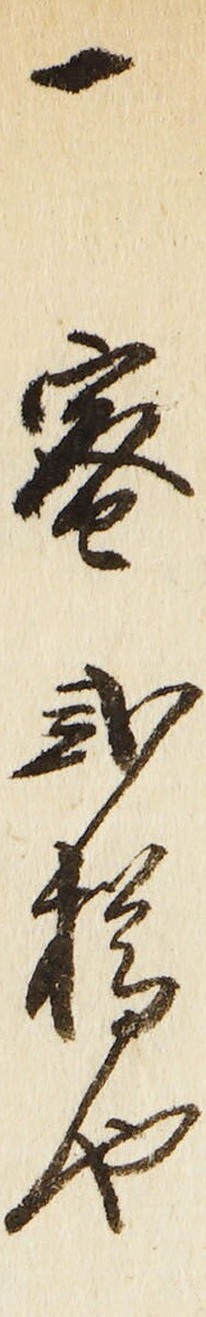一蜜弐樽也
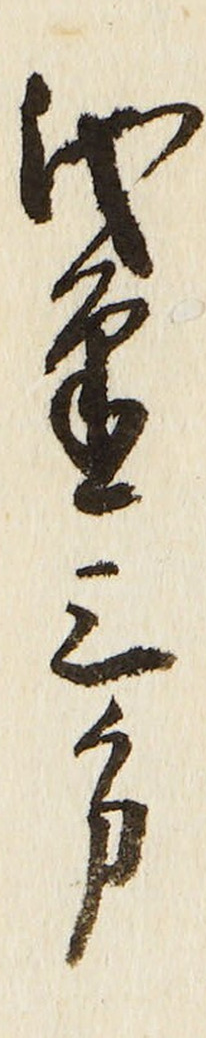代金三分
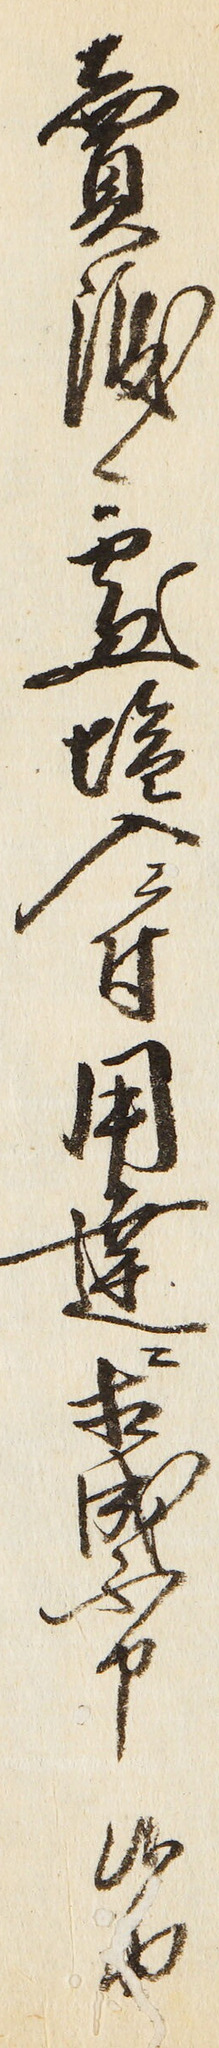売渡候処塩入ニ付用達ニ相成不申候由
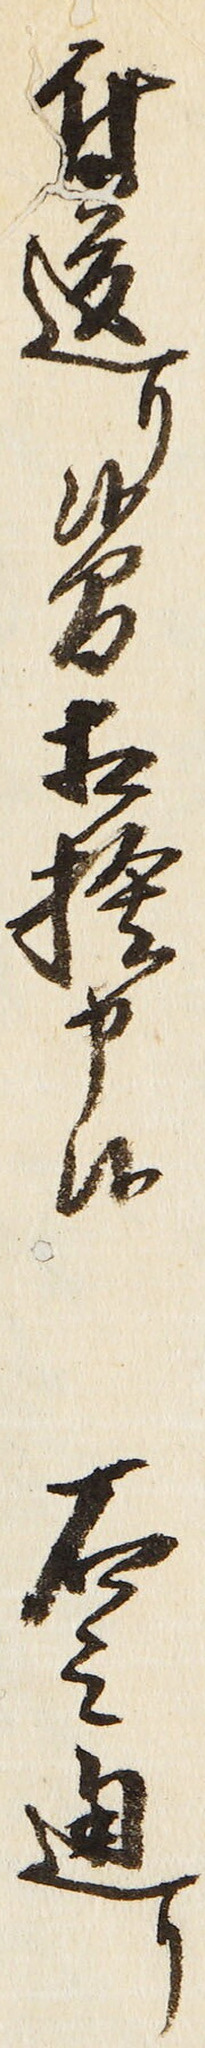付送り候間相捨申候右之通り
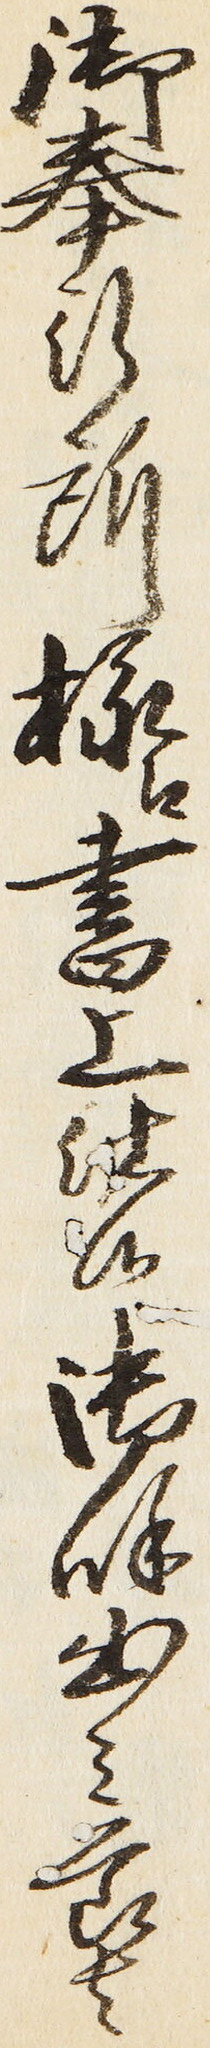御奉行所様江書上仕候御呼出之節者
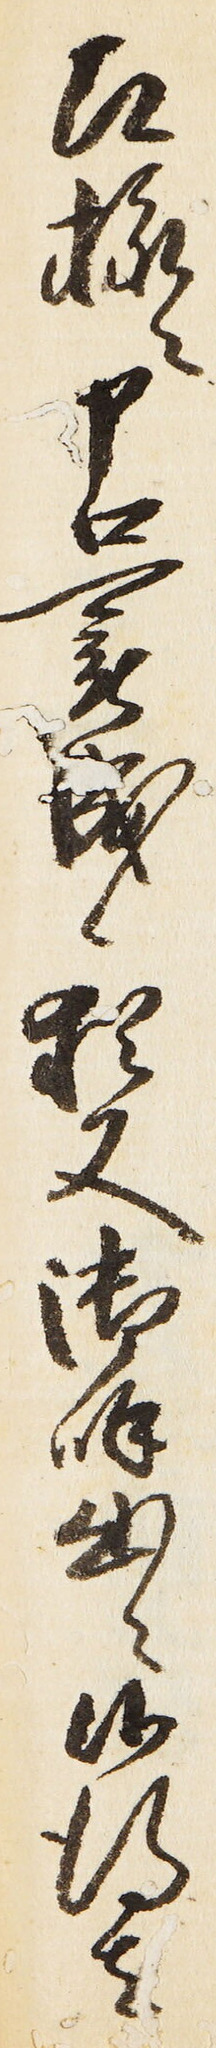左様ニ申口可被成候猶又御呼出ニ候得者
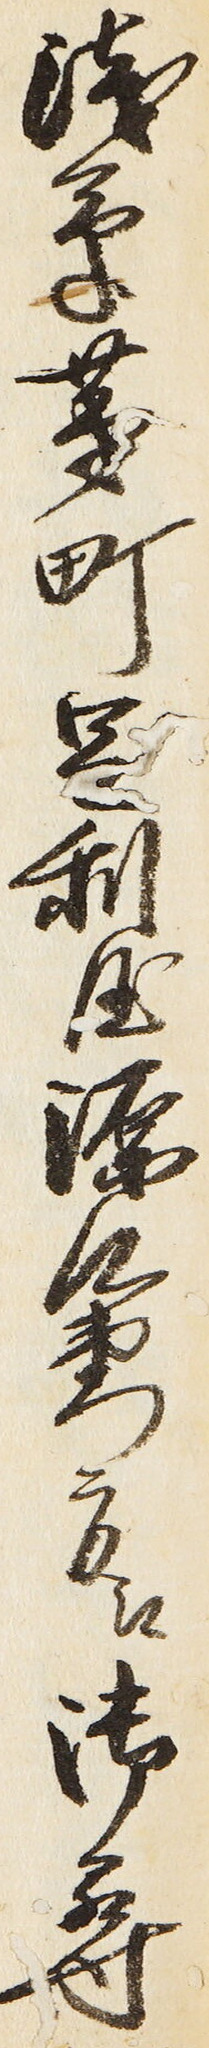浅草茅町足利屋源左衛門方江御尋
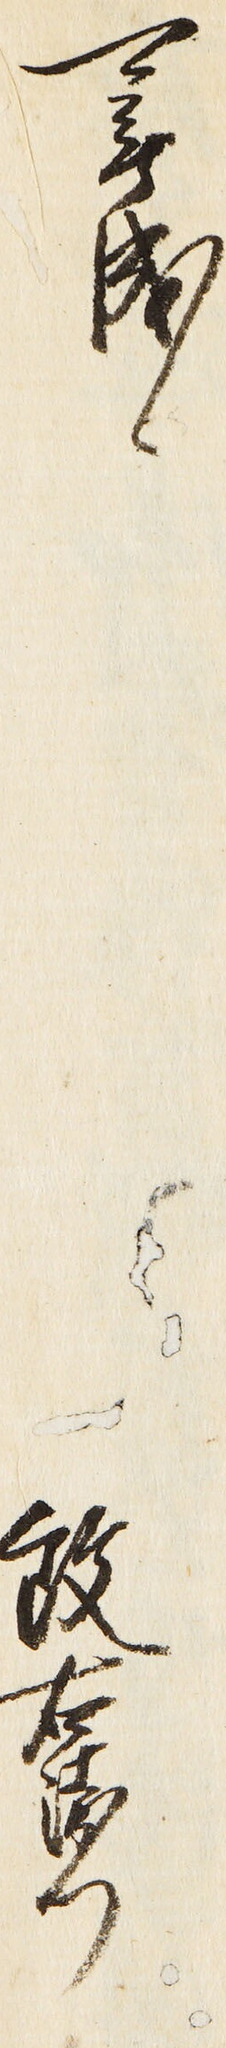可被成候政右衛門
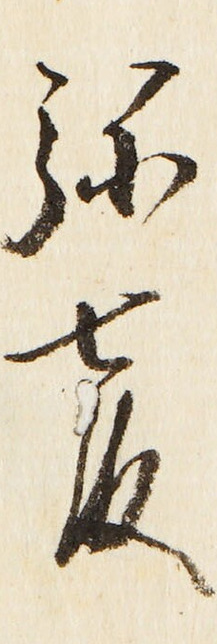弥七殿

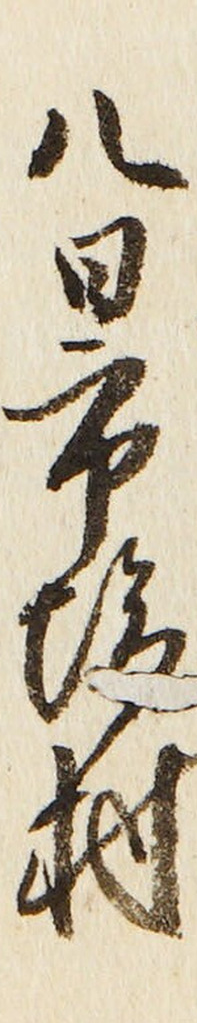八日市場村
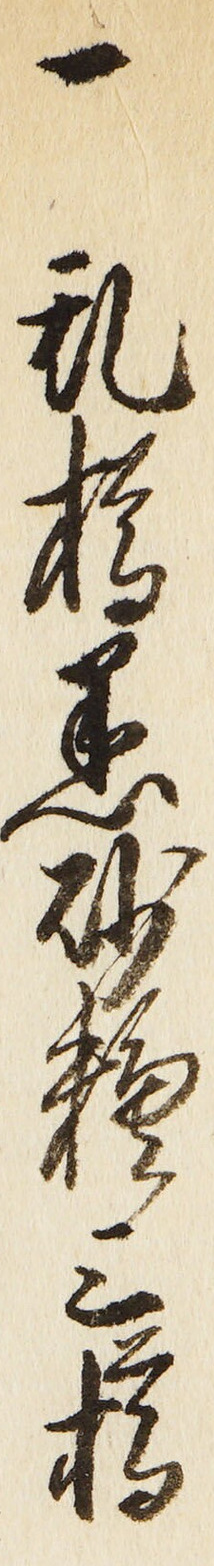一乱樽黒砂糖三樽
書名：難船一件記録
